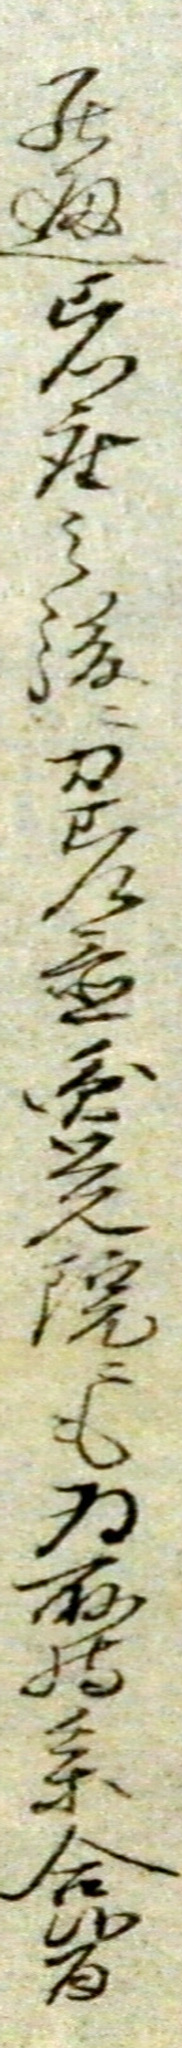罷通着座之後ニ刀差置圓覚院ニ為取持参合候間
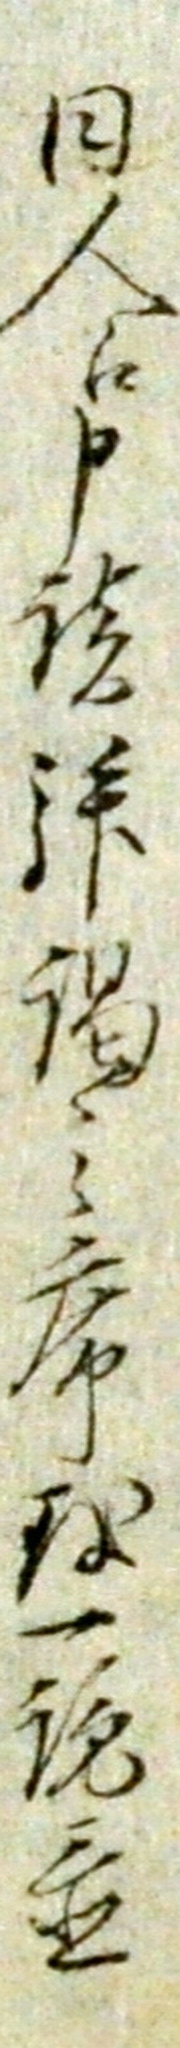同人江申談拝謁之序致可銘置
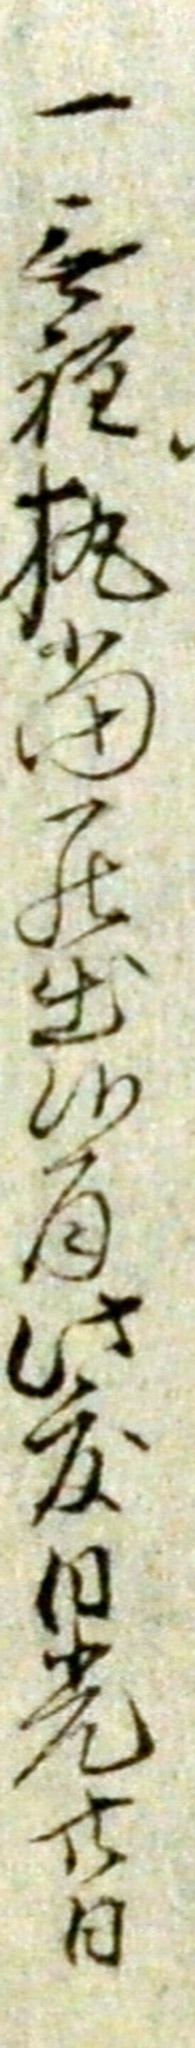一無程執當罷り出候間此度日光廿日
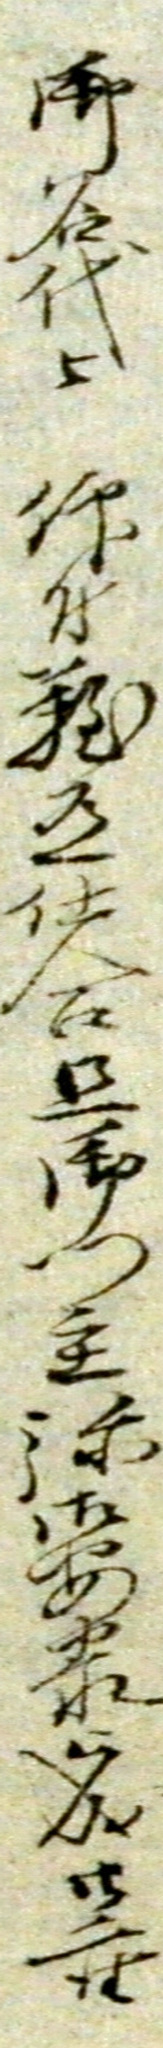御名代ヒ仰付難有仕合且御門主弥御安泰被成御座
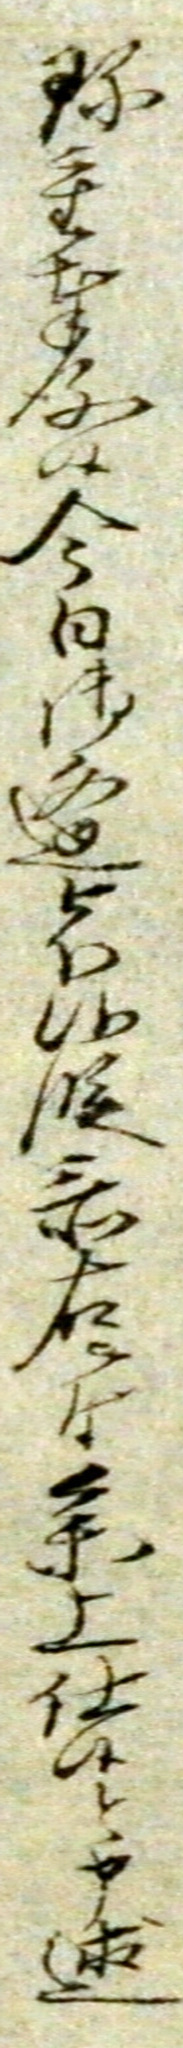珍重奉存候今日御逢ヒ下候右二付参上仕候と申述
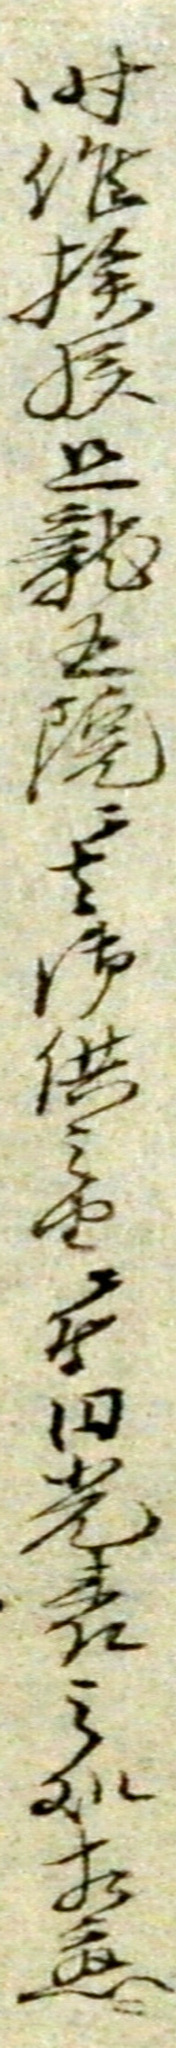時候挨拶且龍王院二者御供之由二付日光表之処相応
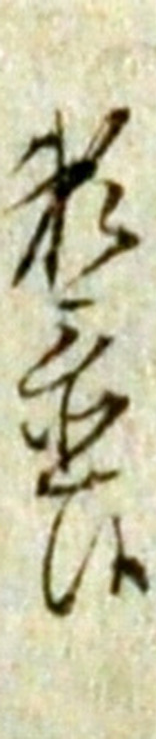頼置候
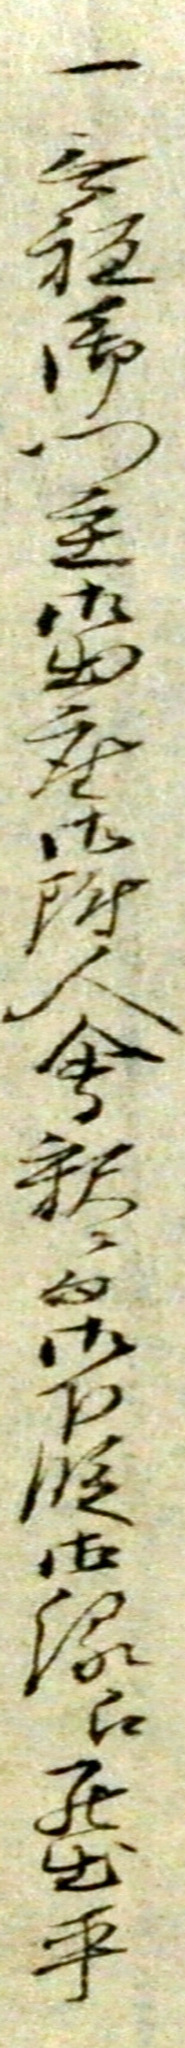一無程御門主御出座御付人会釈ニ而御下段御縁江罷出平
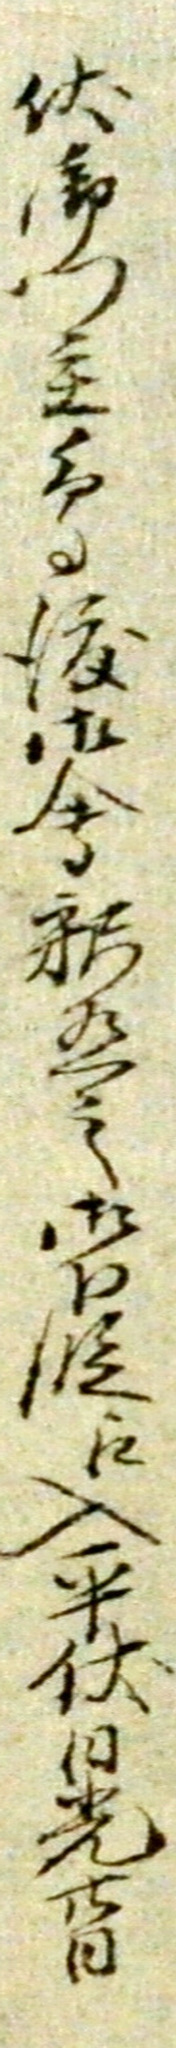伏御門主鳥渡御会釈有之御下段江入平伏日光廿日
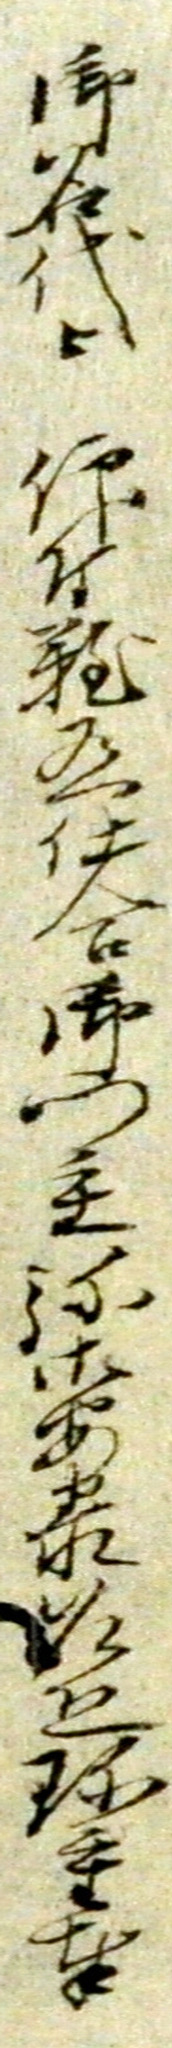御名代ヒ仰付難有仕合御門主弥御安泰乍恐珍重奉
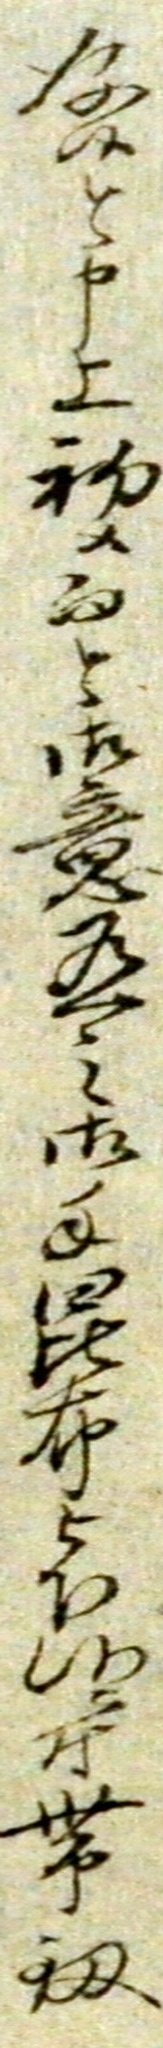存候と申上初メ而と御意有之御手昆布ヒ下候ニ付帯剣
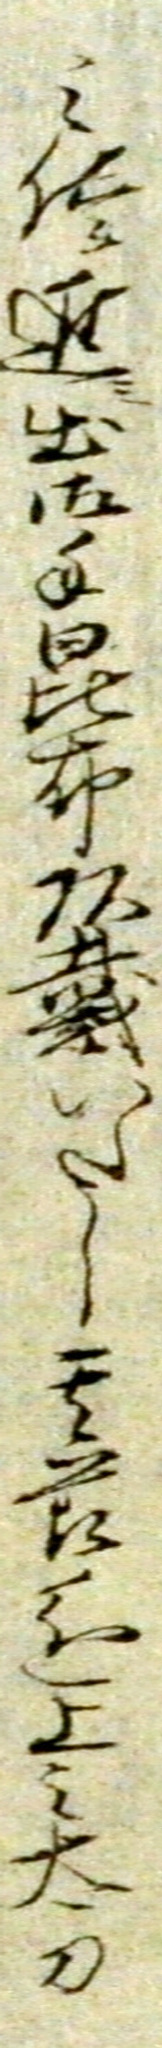之儘進出御手昆布頂戴いたし其節進上之太刀
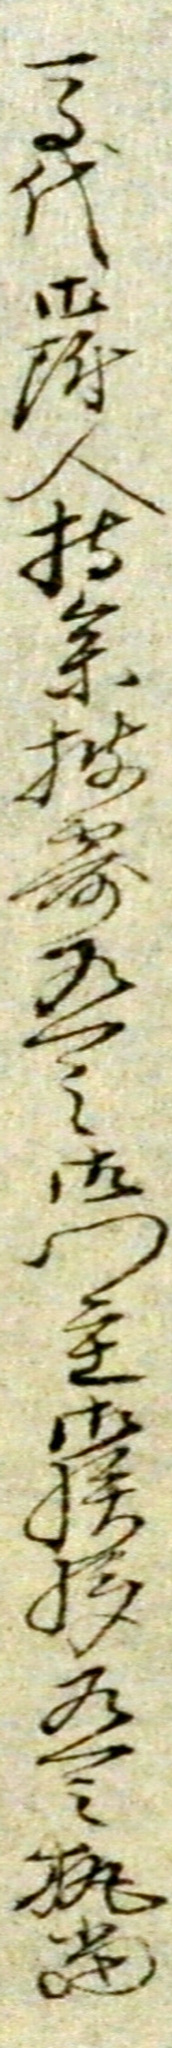馬代御附人持参披露有之御門主御挨拶有之執當
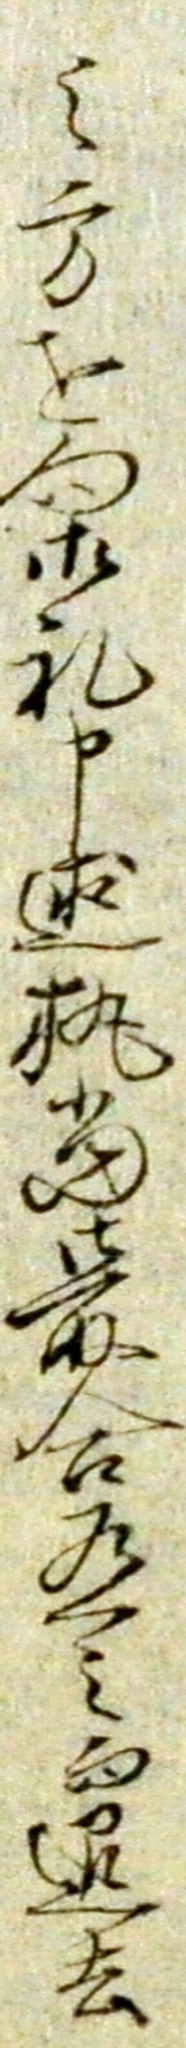之方を向御礼申述執當御取合有之而退去
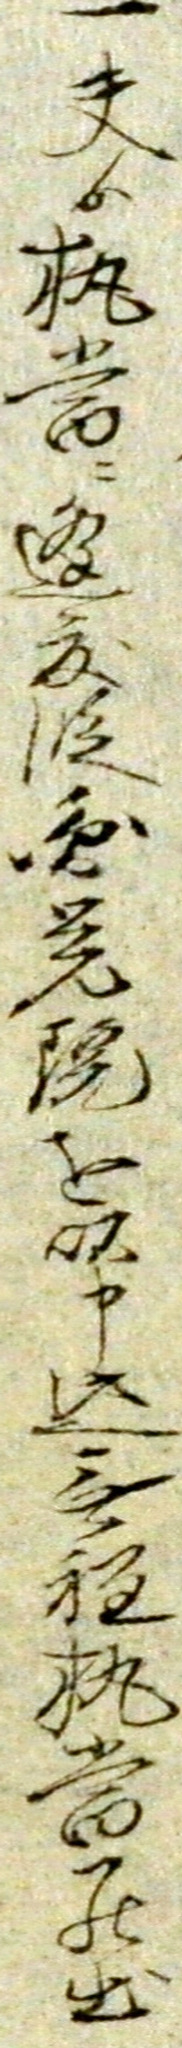一夫ゟ執當ニ逢度段圓覚院を以申込無程執當罷出
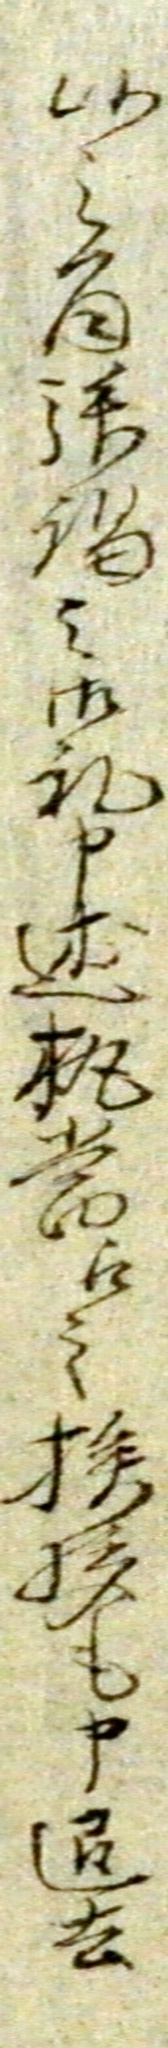候之間拝謁之御礼申述執當江之挨拶も申退去
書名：日光御名代相勤候節ノ留
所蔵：伊那市立高遠町図書館・合同会社AMANE
